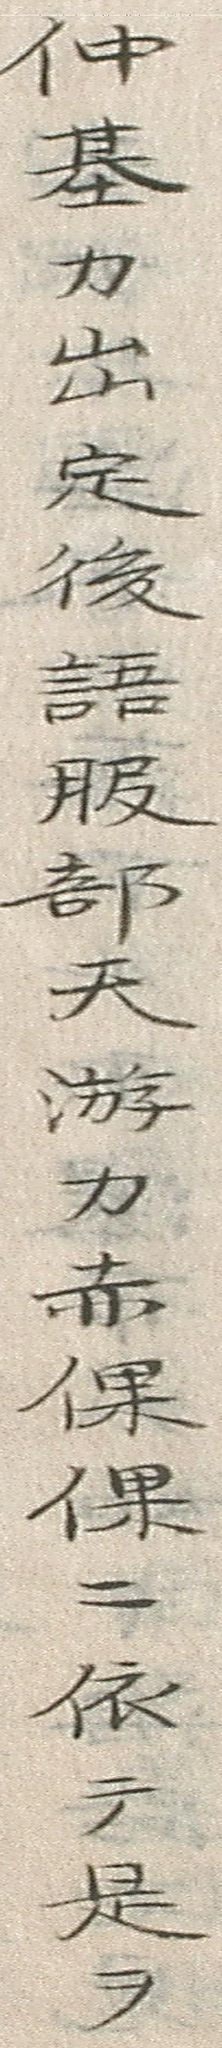仲基カ出定後語服部天游カ赤倮倮ニ依テ是ヲ
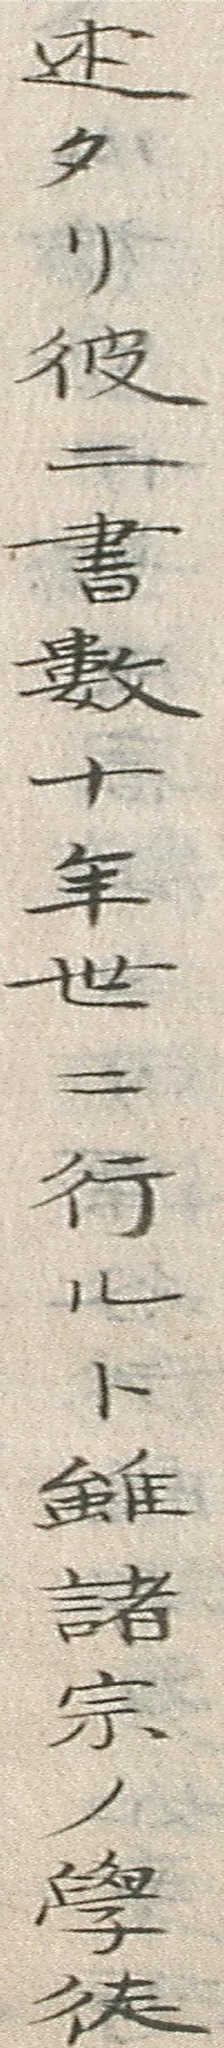述タリ彼ニ書数十年世ニ行ルト雖諸宗ノ学徒
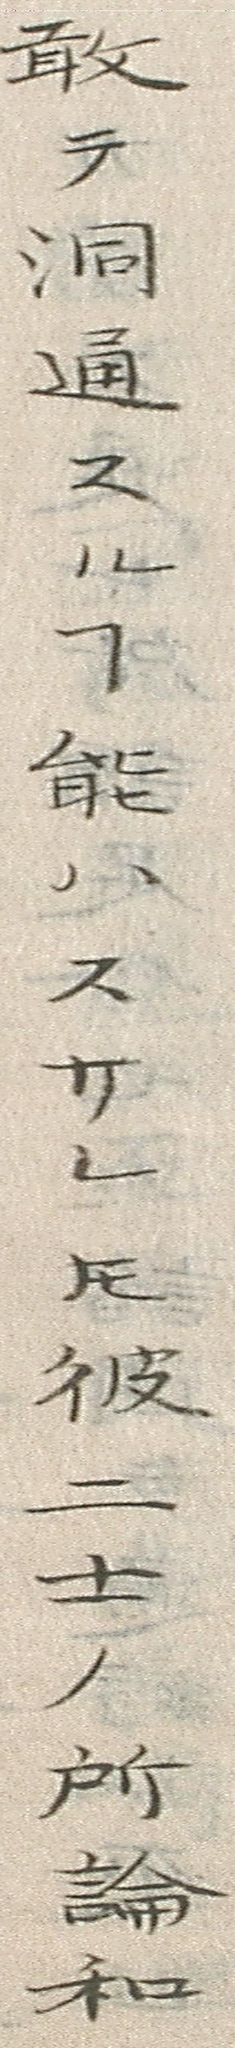敢テ洞通スルコト能ハスサレトモ彼二士ノ所論和
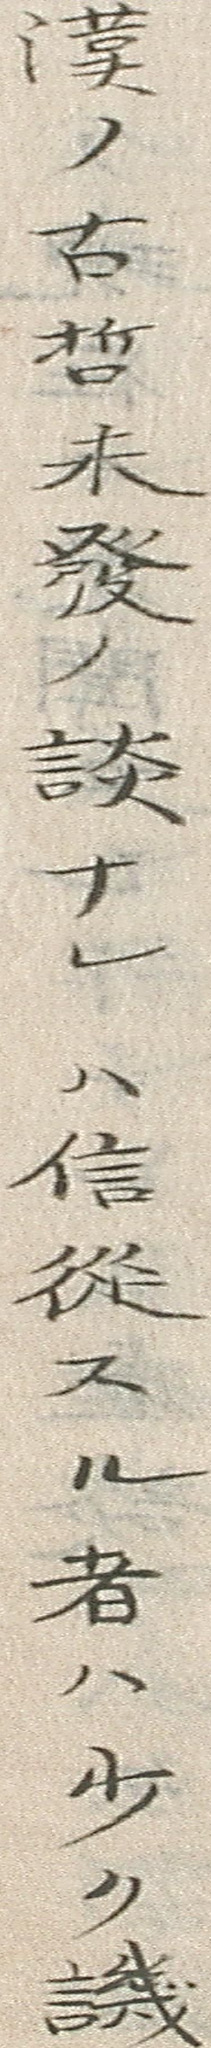漢ノ古哲未発ノ談ナレハ信徒スル者ハ少ク譏
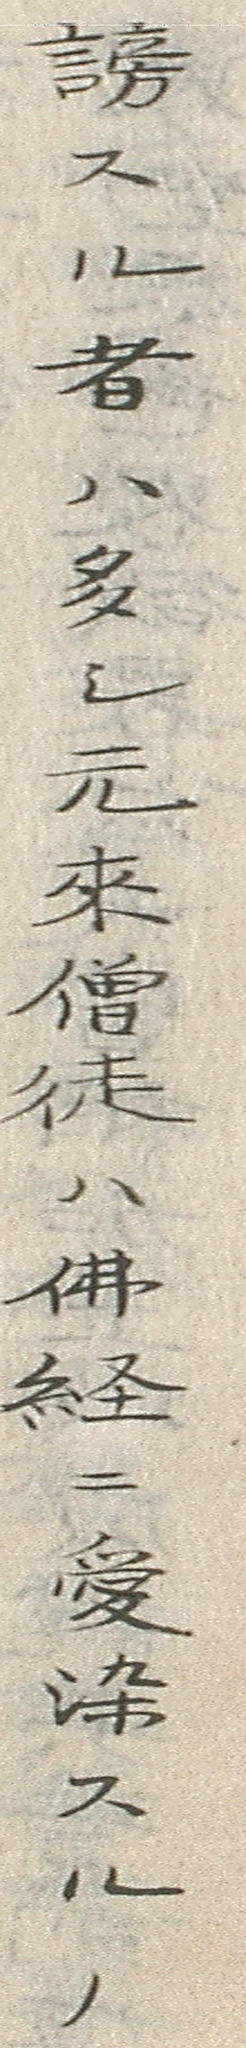謗スル者ハ多シ元来僧徒ハ仏経ニ愛染スルノ
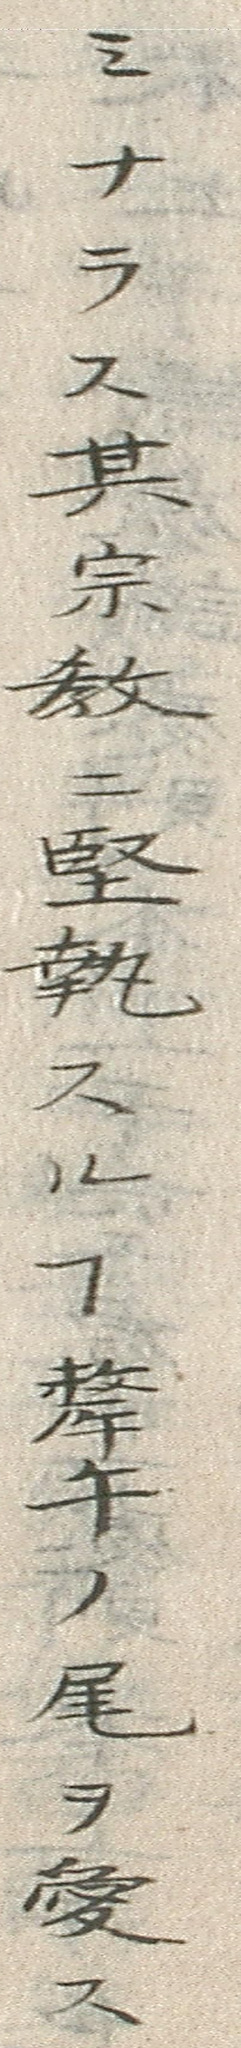ミナラス其宗教ニ堅執スルコト犛牛ノ尾ヲ愛ス
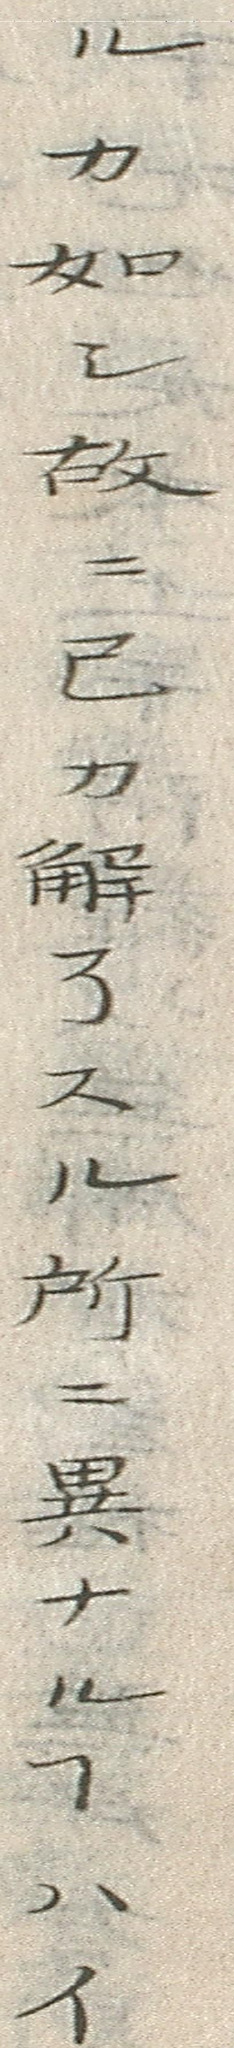ルカ如シ故ニ己カ解了スル所ニ異ナルコトハイ
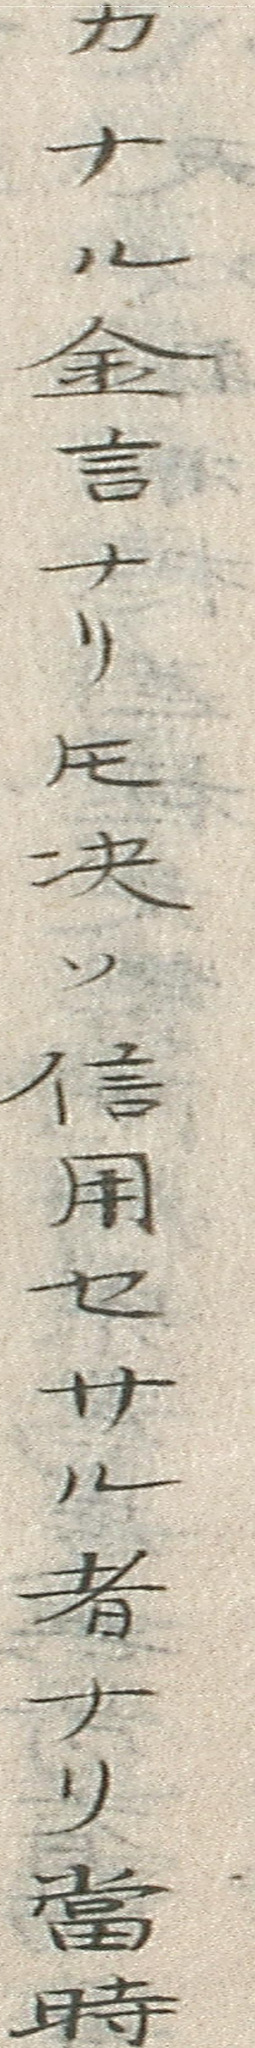カナル金言ナリトモ决ソ信用セサル者ナリ当時
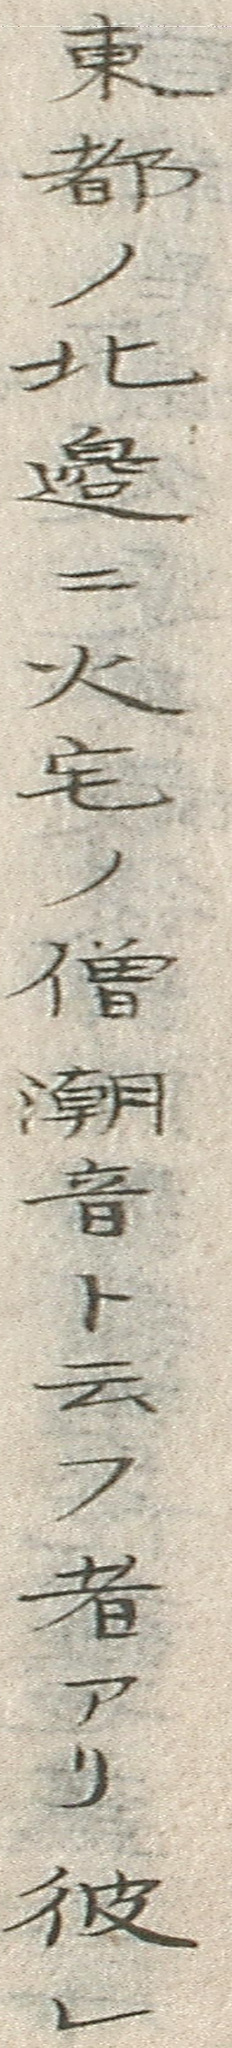東都ノ北辺ニ火宅ノ僧潮音ト云フ者アリ彼レ
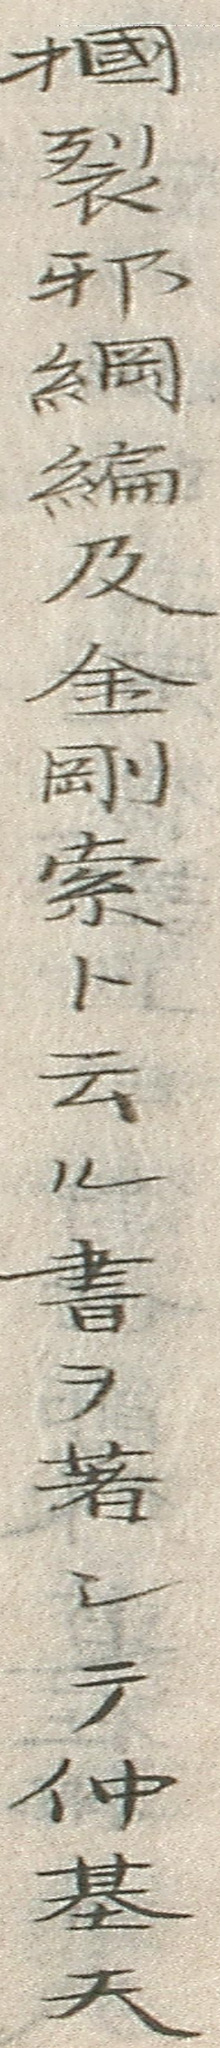掴裂邪綱編及金剛索ト云ル書ヲ著シテ仲基天
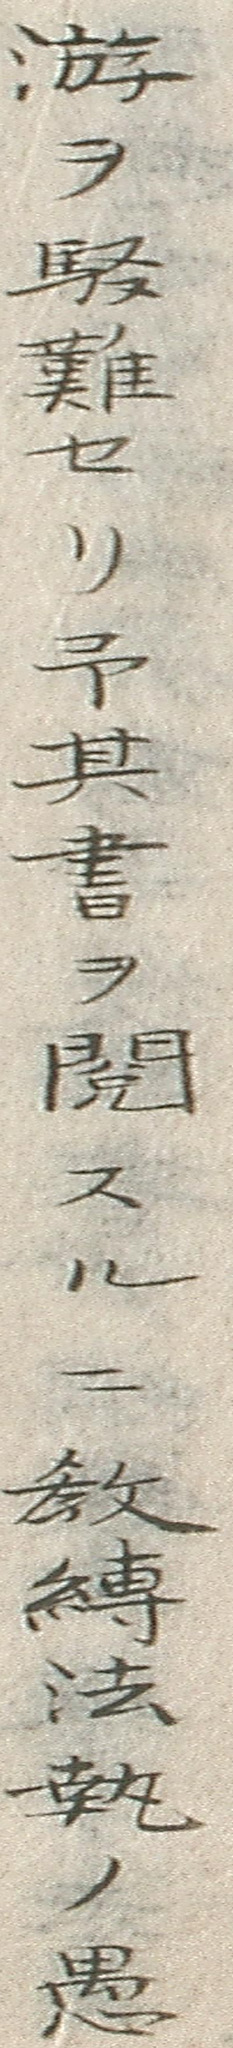游ヲ騒難セリ予其書ヲ閲スルニ教縛法執ノ愚
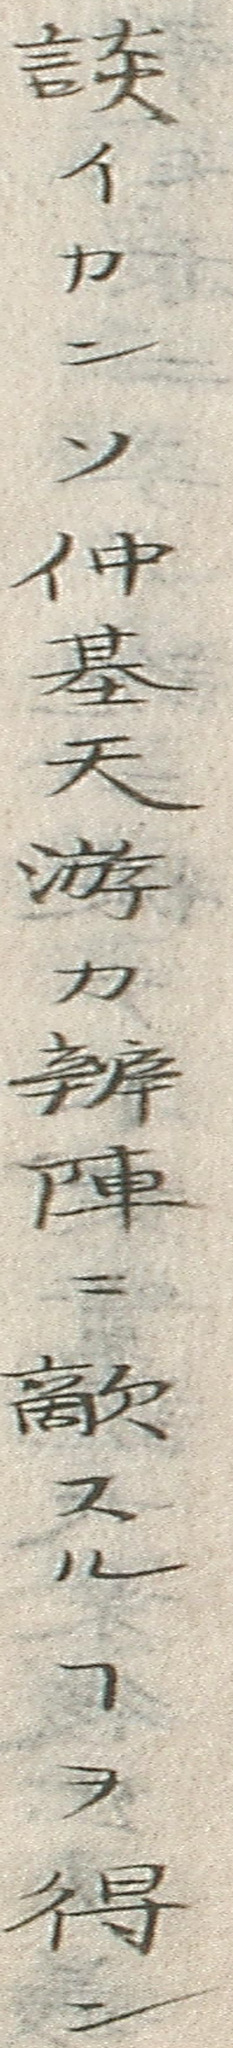談イカンソ仲基天游カ弁陣ニ歒スルコトヲ得ン
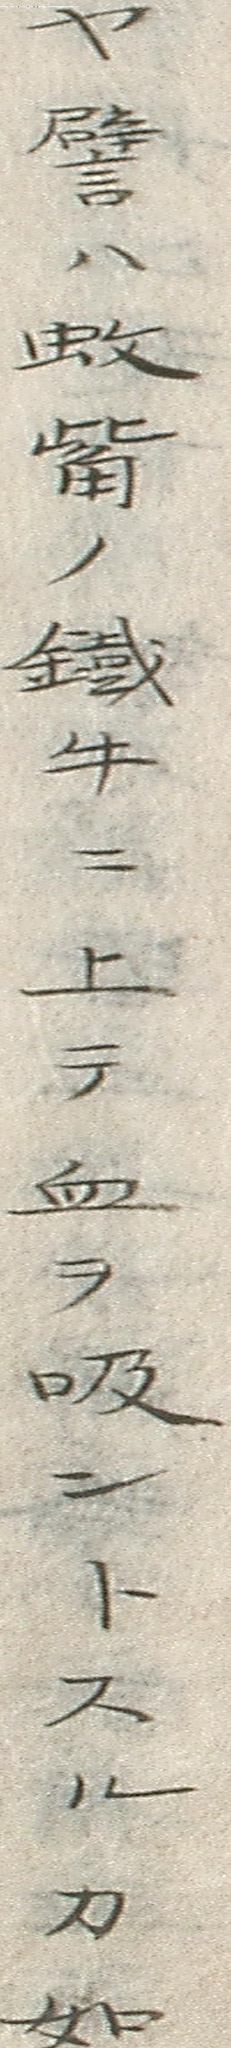ヤ譬ハ蚊觜ノ鉄牛ニ上テ血ヲ吸ントスルカ如
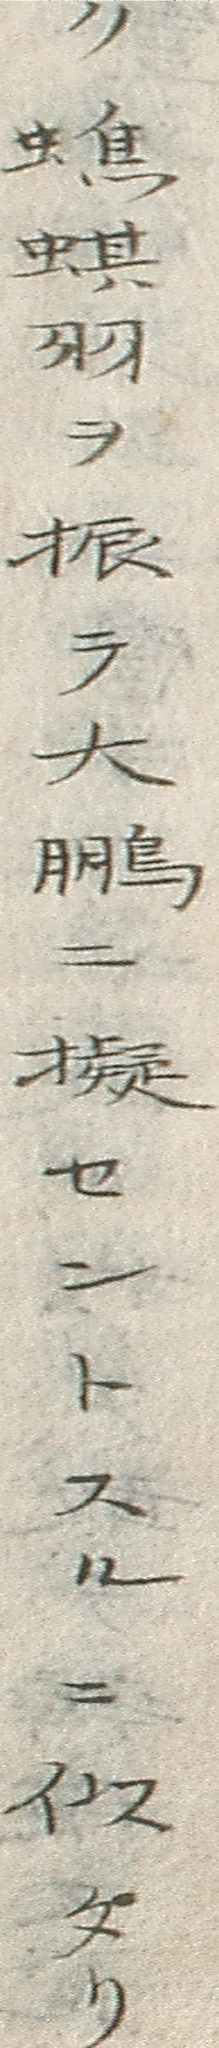ク蟭蜞羽ヲ振テ大鵬ニ擬セントスルニ似タリ

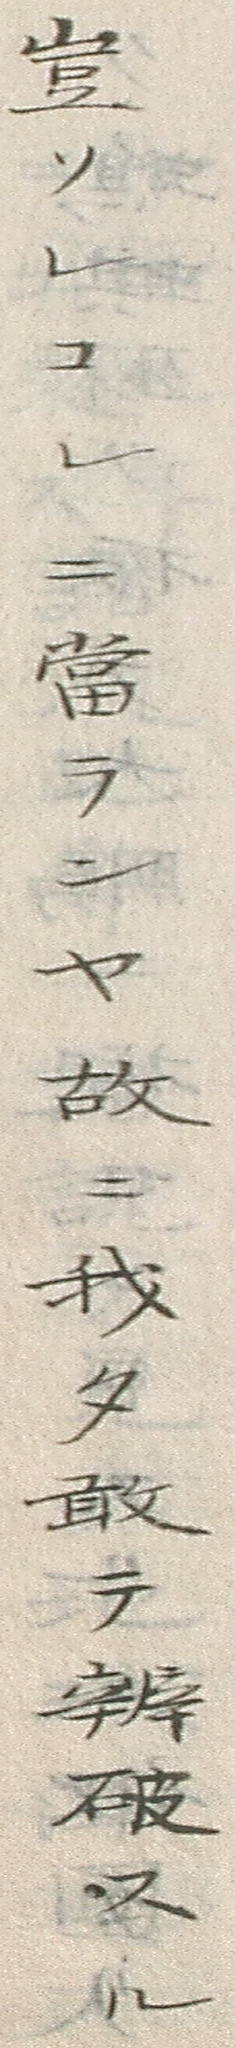豈ソレコレニ当ランヤ故ニ我タ敢テ弁破スル
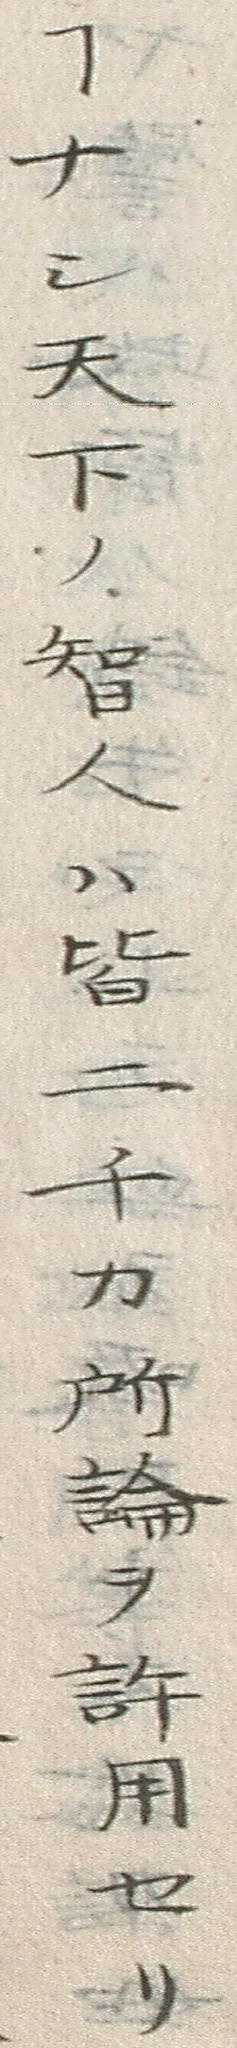コトナシ天下ノ智人ハ皆二千カ所論ヲ許用セリ
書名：天學略名目羽翼　全
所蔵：東京大学地震研究所図書室 Earthquake Research Institute Library, The University of Tokyo, JAPAN
